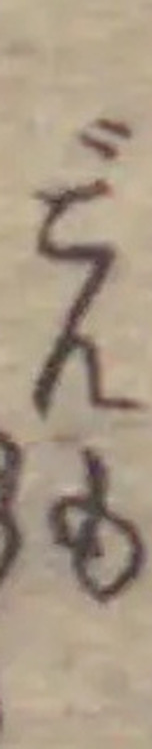ごんも
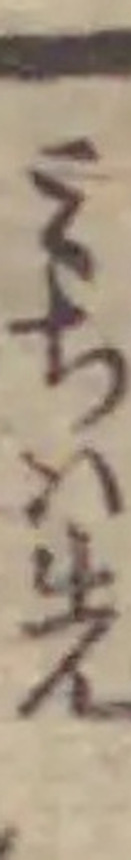みちは先
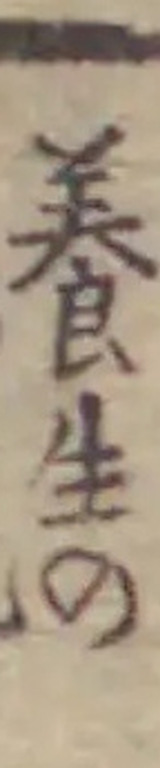養生の
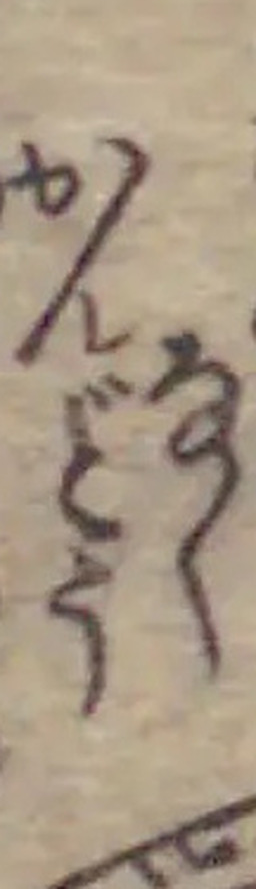かんどう
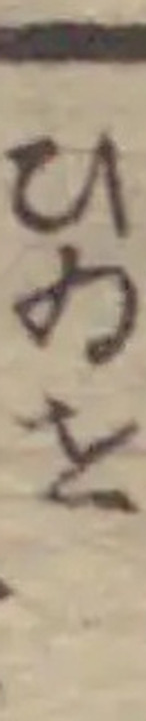ひゐを
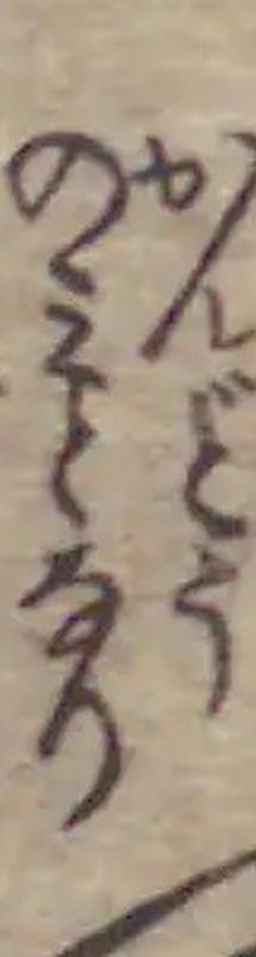のみとなり
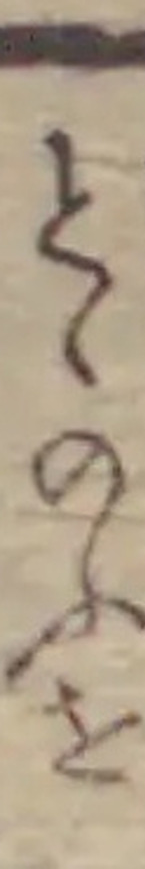とゝのふを
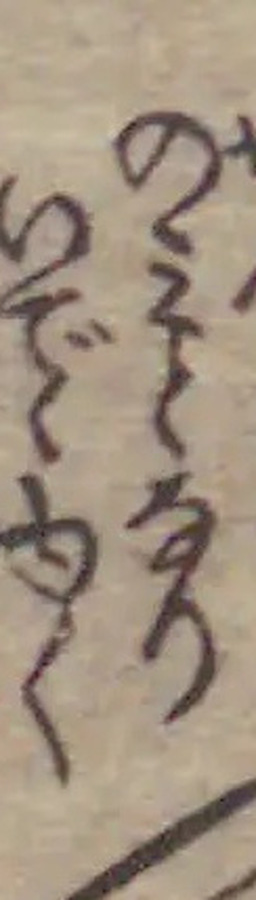いでてゆく
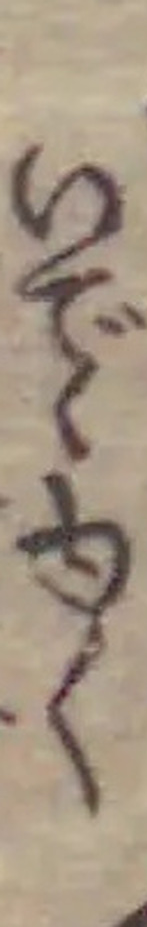いでてゆく
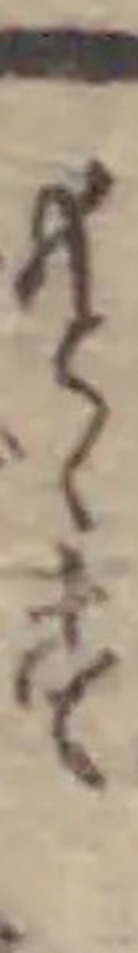もとゝす
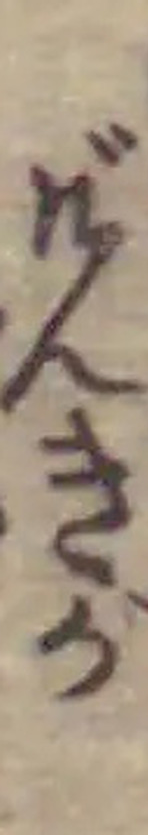げんきが
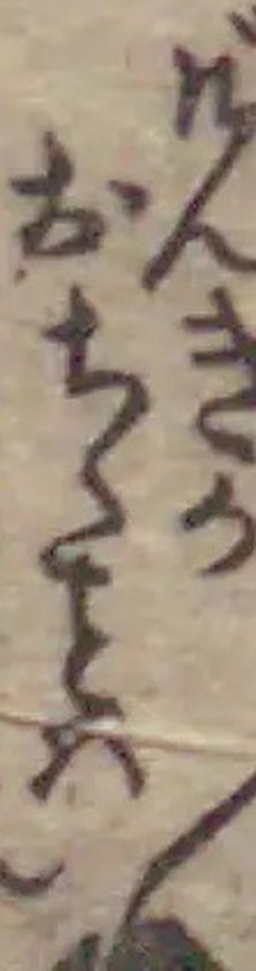おちたとは
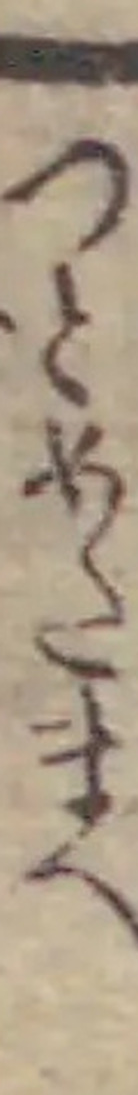つとめたまへ
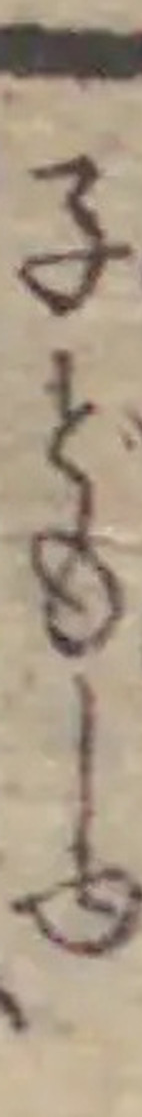子どもしゆ
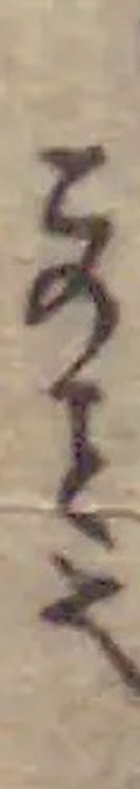このこと也
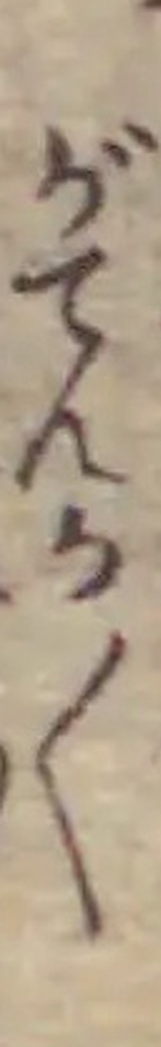がてんか〳〵
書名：腹内養生主論 3巻
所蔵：国立国会図書館 National Diet Library, JAPAN
